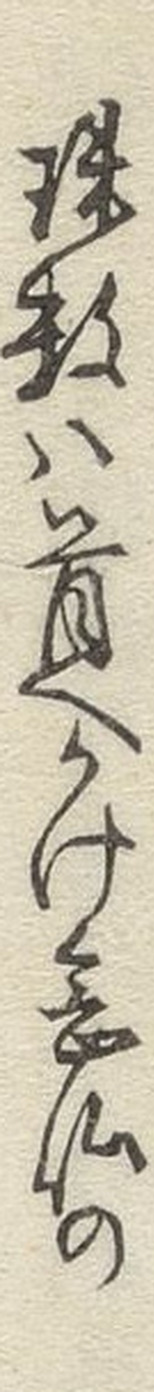珠数は首へかけ念仏の
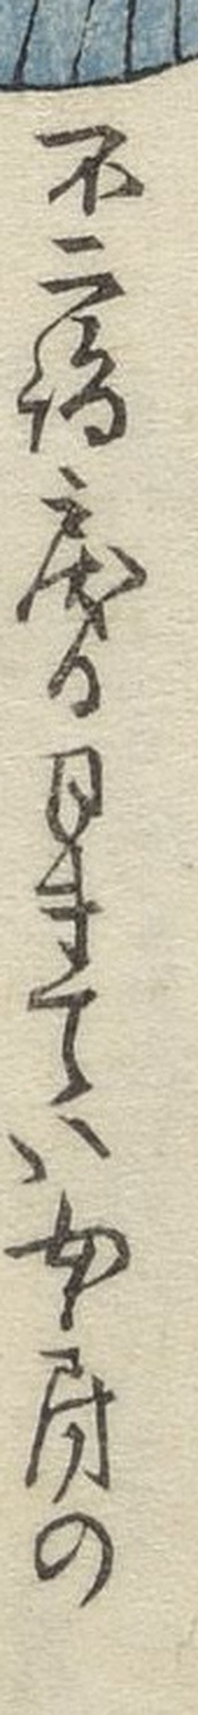不二詣で戻る日まては女房の
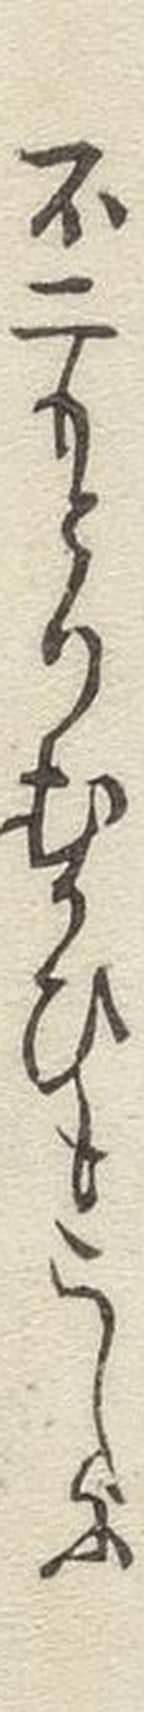不二もとりむかひもこしに
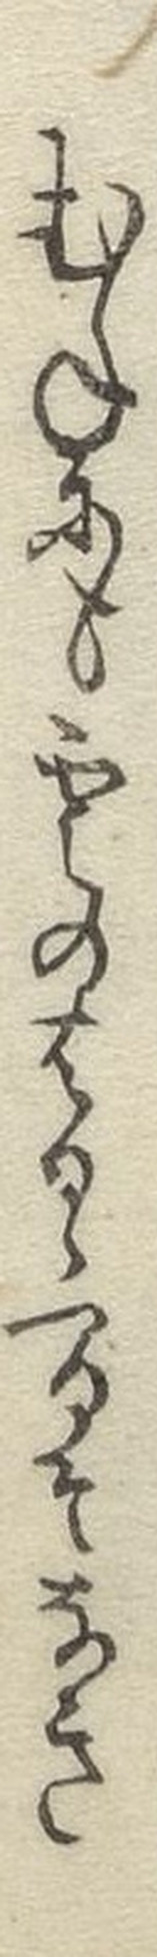むねにも雲のはるゝ一日そ
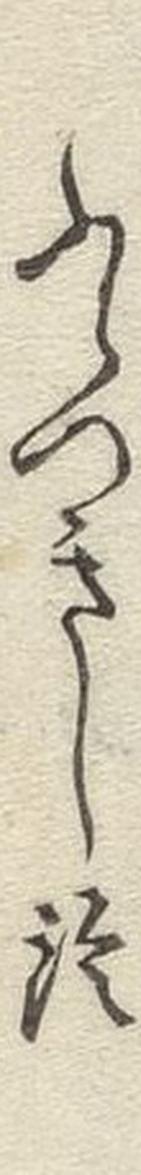ふらしつきし鈴
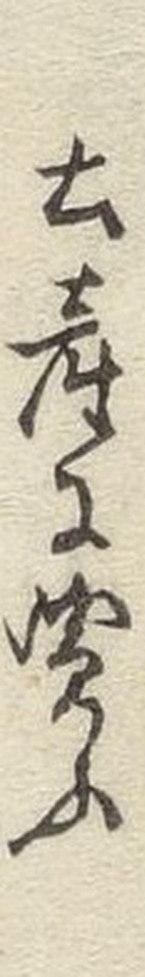土産に買ふ
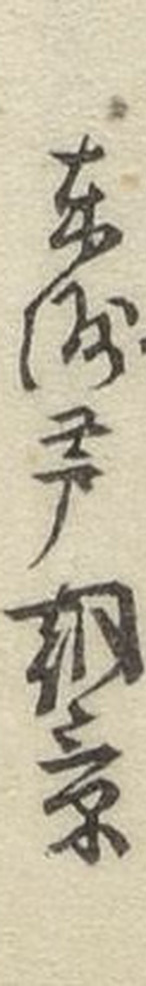東洲芦朝景
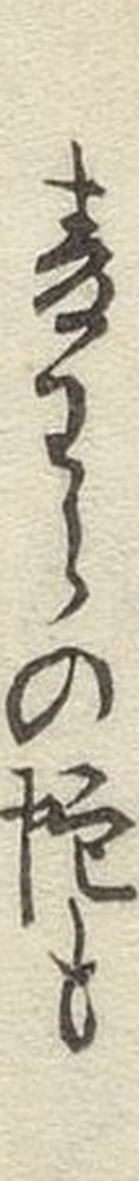麦わらの蛇も
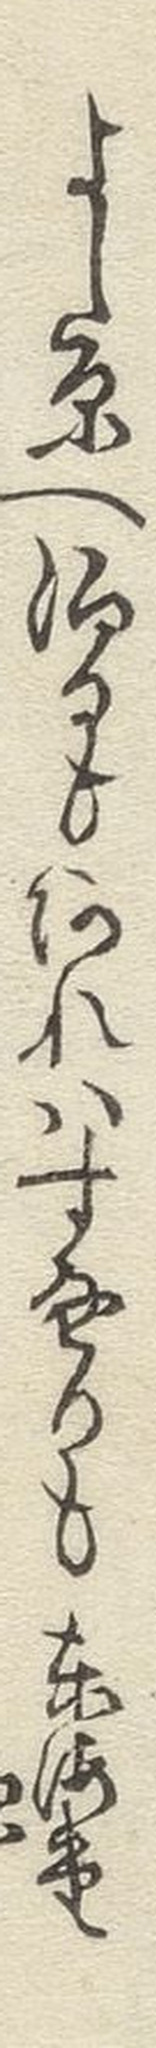よし原へ泊るもあれはす通りも東海堂
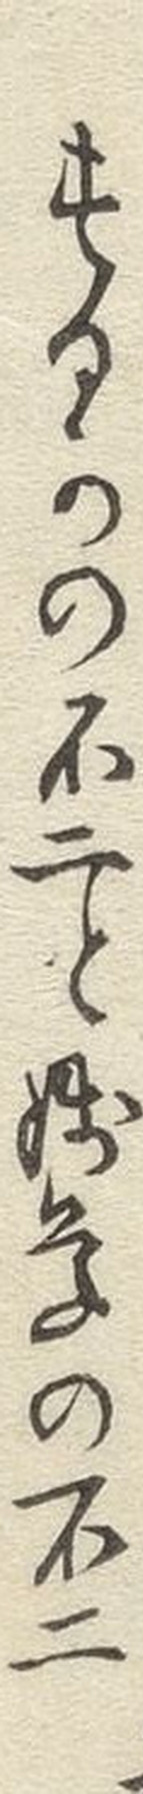するかの不二と浅草の不二歌重
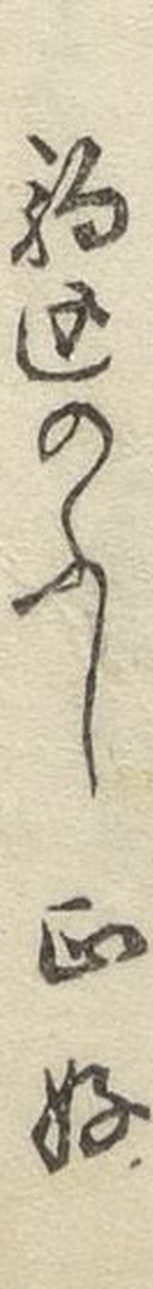駒込のふし正好
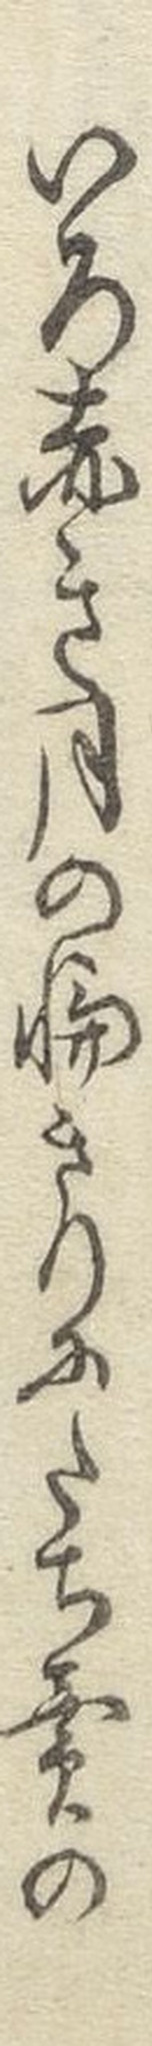いろ赤き月の輪きりにたち売の
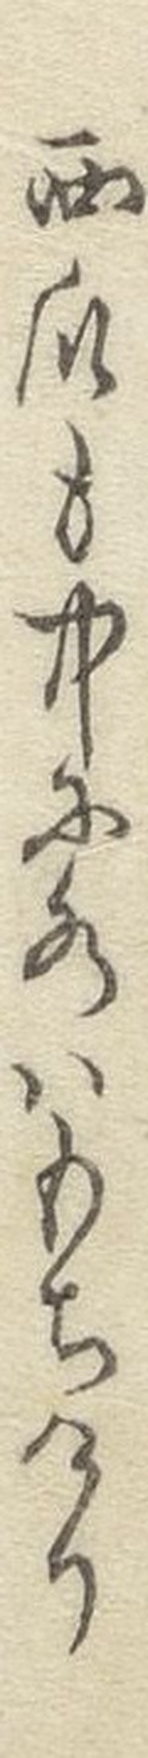西瓜も中に水はもしけり
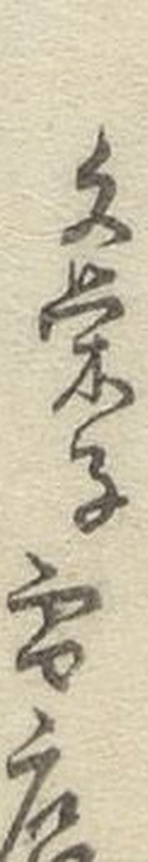文栄子雪麿
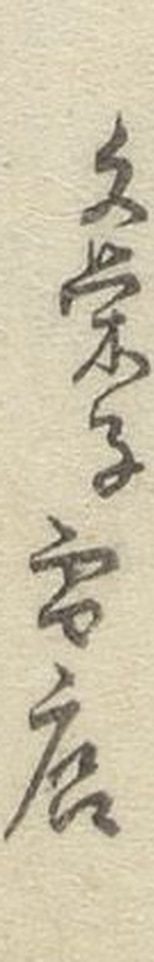文栄子雪麿
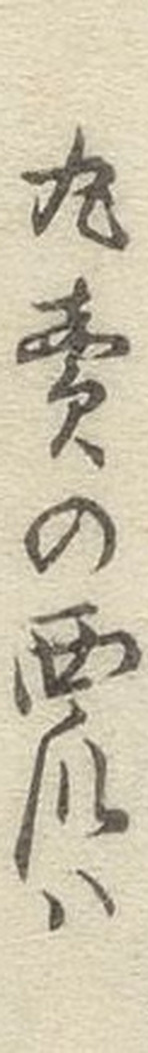丸売の西瓜は
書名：Picture Album of People with Kyōka (Light Verse) (Kyōka shiki jinbutsu 狂歌四季人物)
